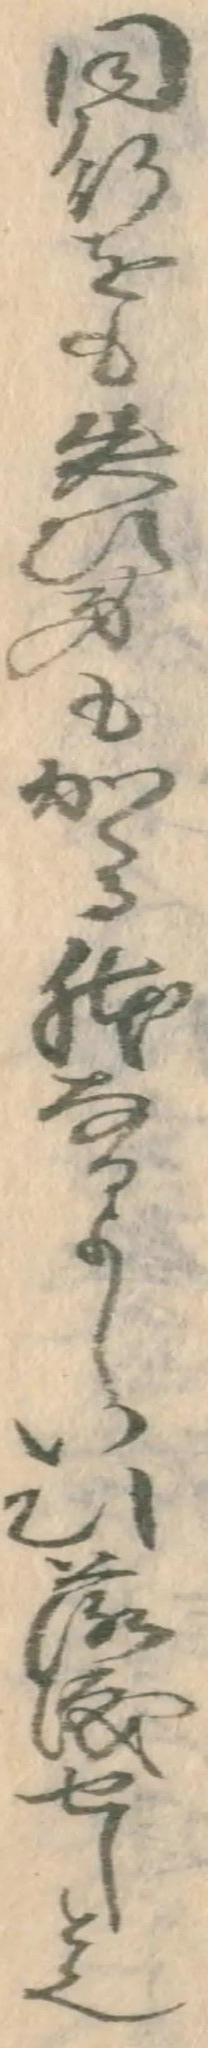同行をも失ひ身もかかる体なるよしいひ落涙せしと也

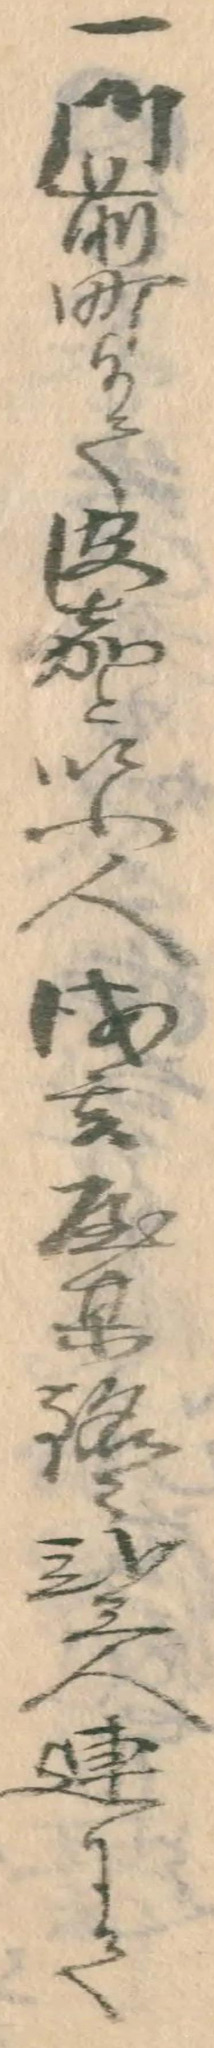一門前町にて波嘉といふ人戌亥屋某銘々弐三人連にて
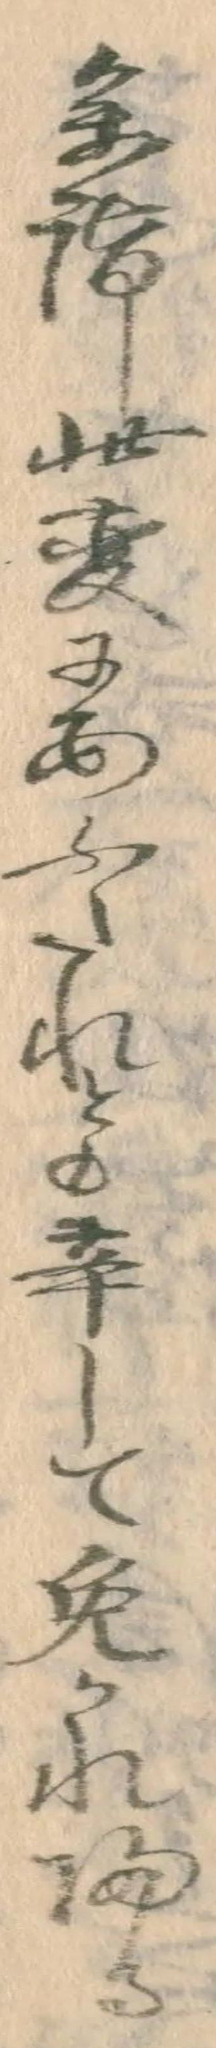参詣し此変にあふたれとも辛して免かれ帰る
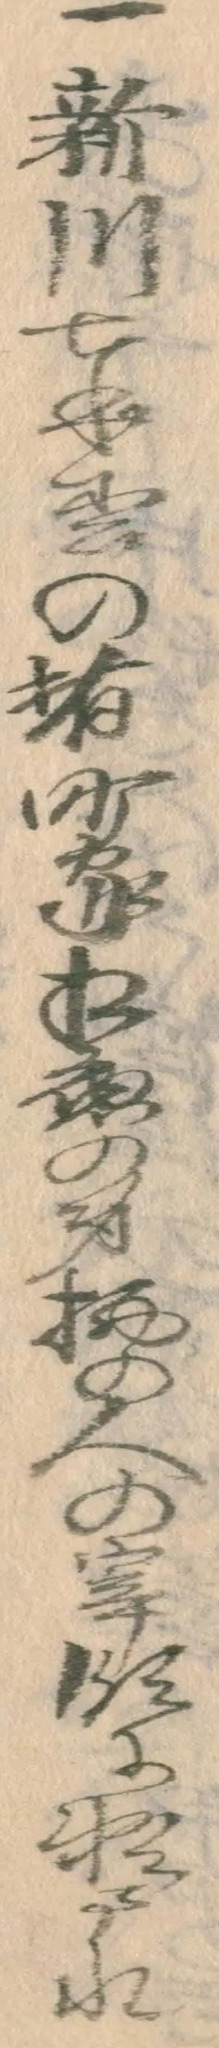一新川七本松の者町家相応身柄の人の宰領に頼まれ
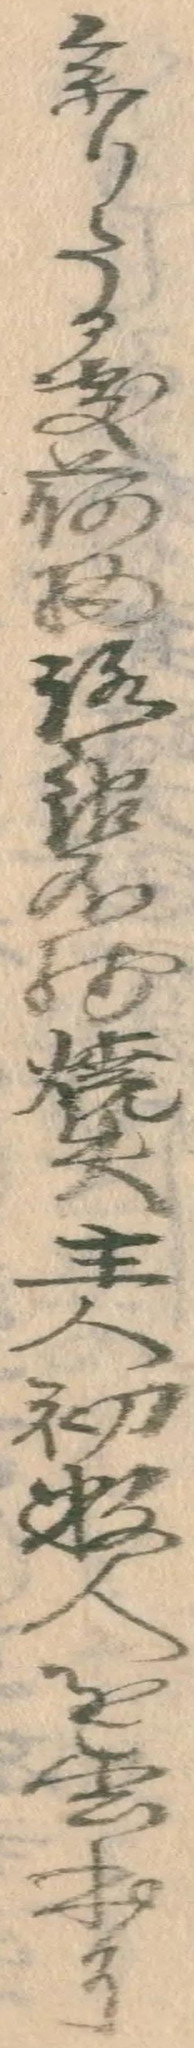参りたる処荷物路銀不残焼失主人初頼人を松本て
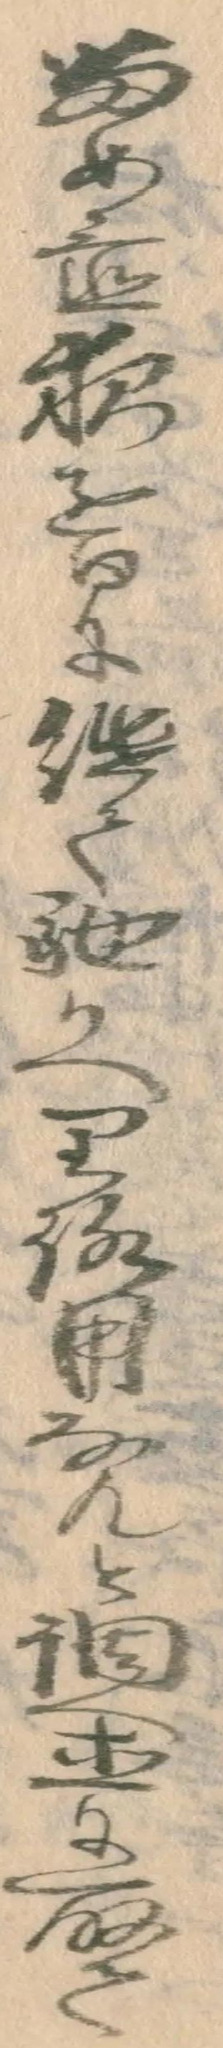留め置夜を日に継て馳かへり路用なんと調へ直に取て
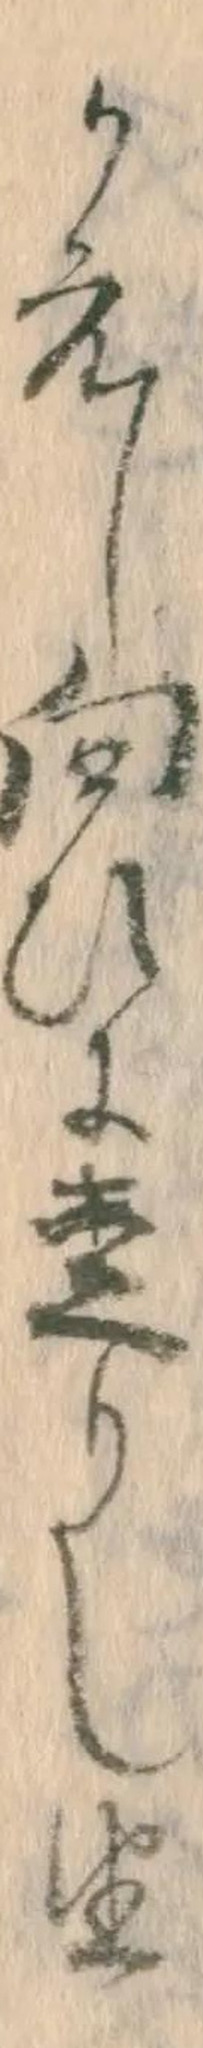かえし向ひに走りし由
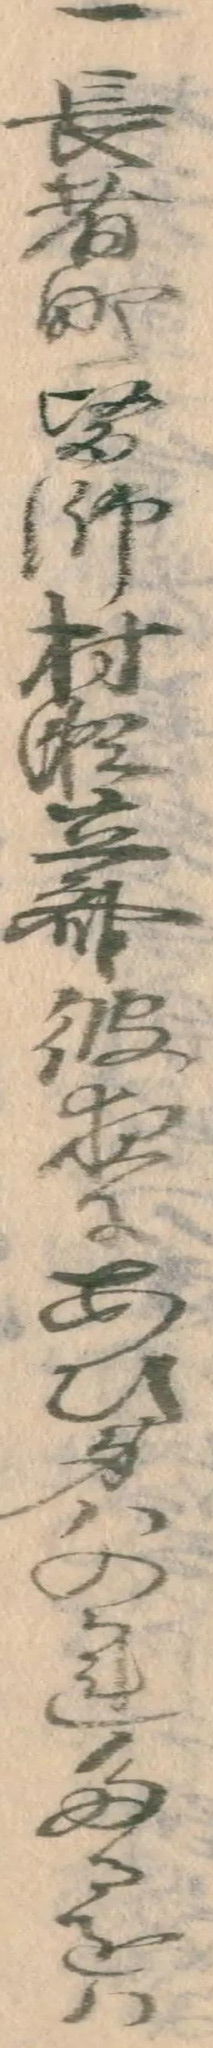一長者町皆御村頼立斎彼夜にあひ身ハのかれたるをハ
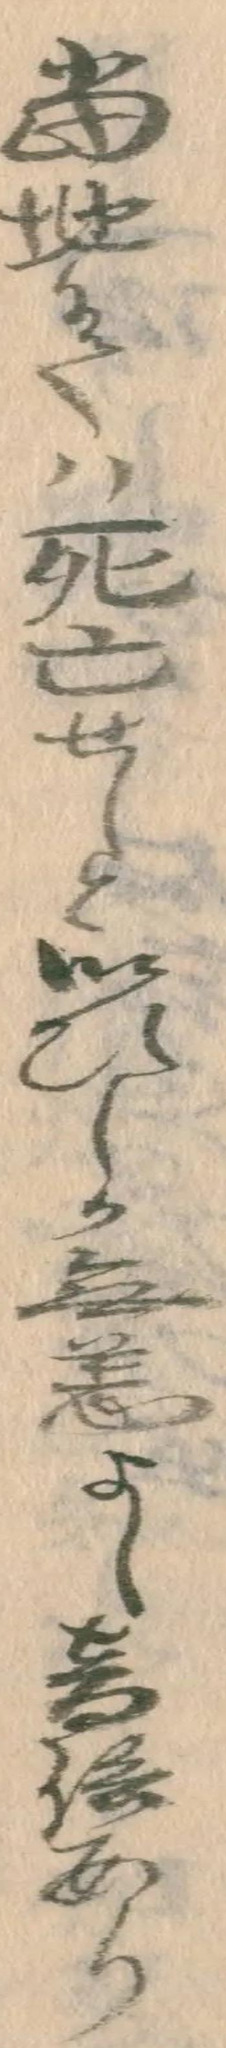当地にてハ死亡せしといひしか無恙よし音信あり
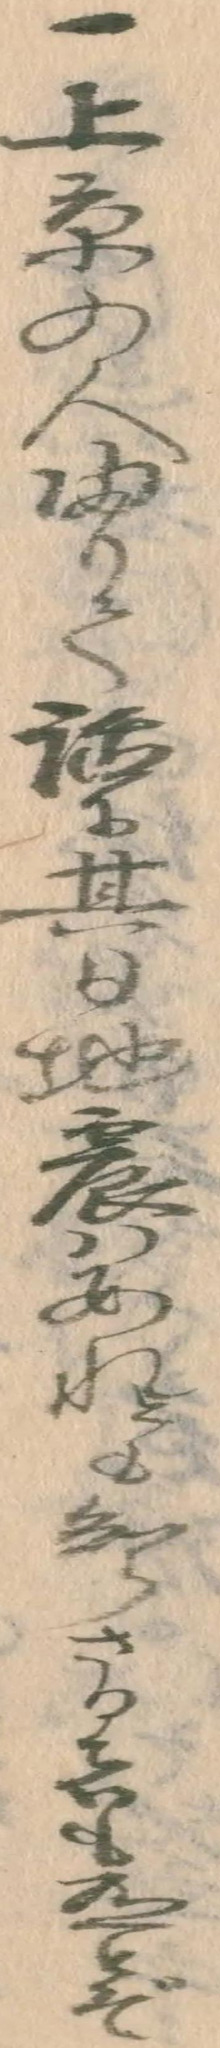一上京の人ありて話に其日地震ハあれとも知らざる者も有とぞ
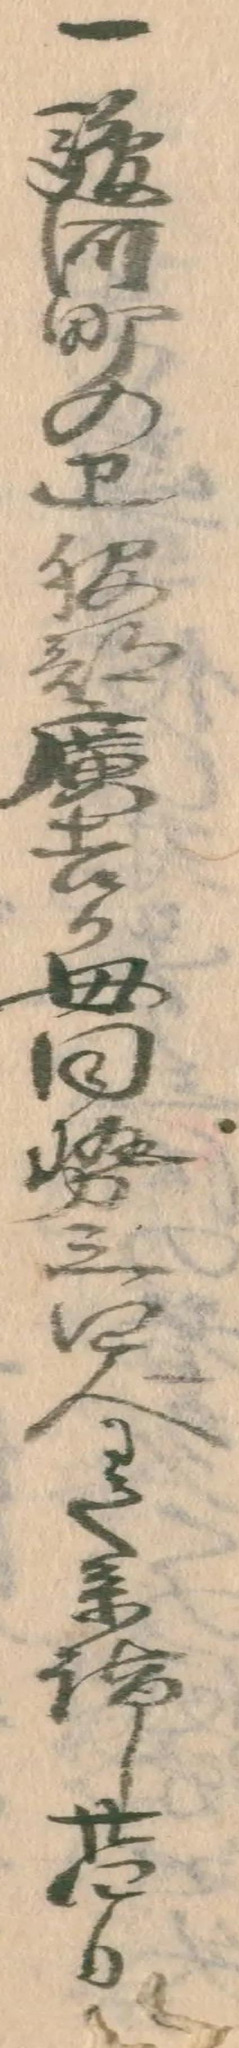一駿河町の辺脇部広吉か母同勢三四人にて参詣し廿四日
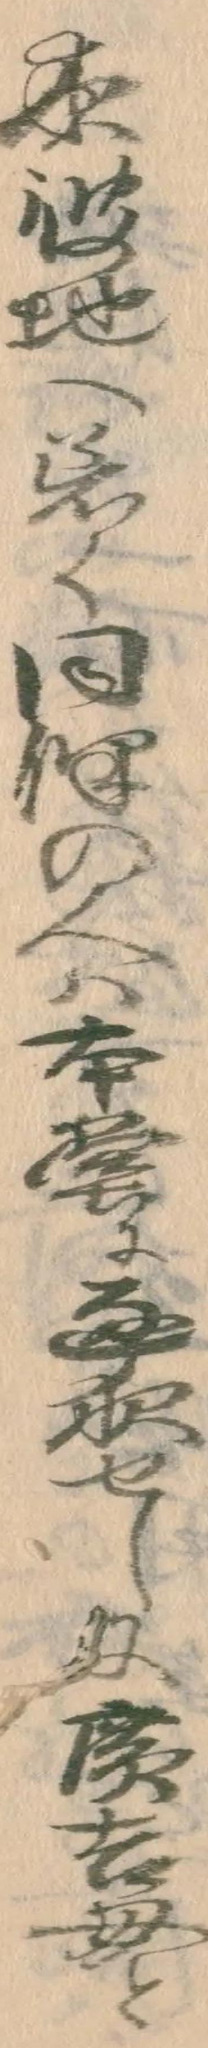夜彼地へ着く同伴の人は本堂に過夜せしに広吉母と
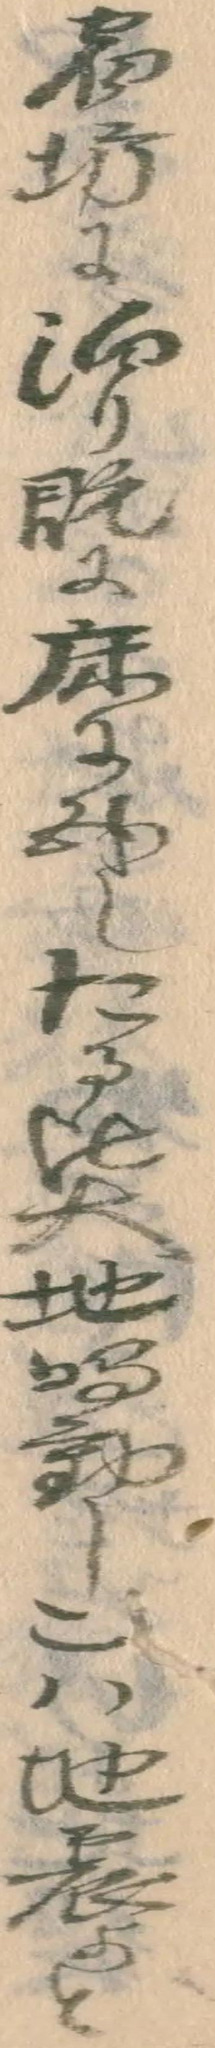宿坊に泊り既に床に臥したる比大地鳴動しこハ地震と
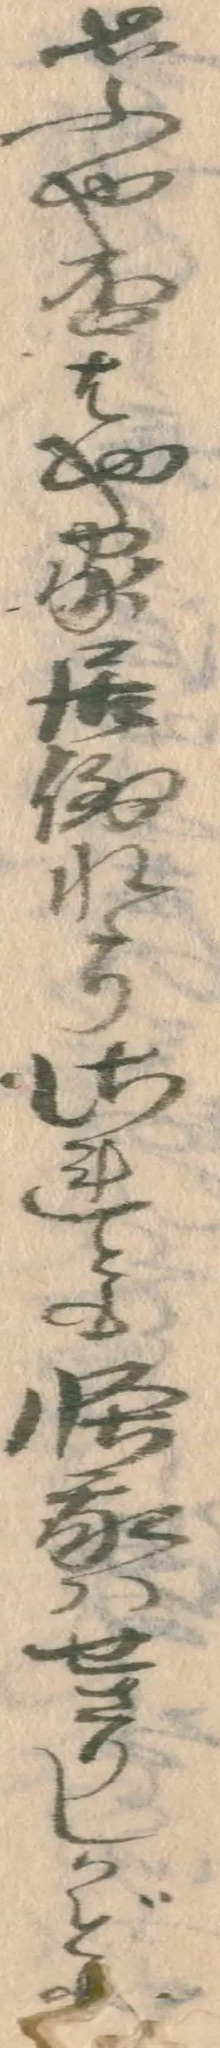思ふや否はや家居倒れりつれとも怪我ハせさりしかど
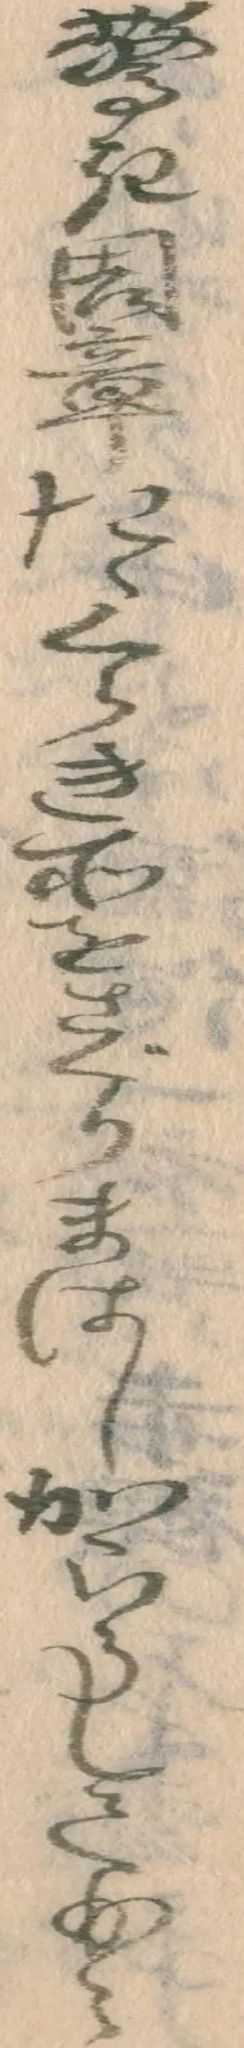驚き周章たゝくらき所をさぐりまはしからうして木の
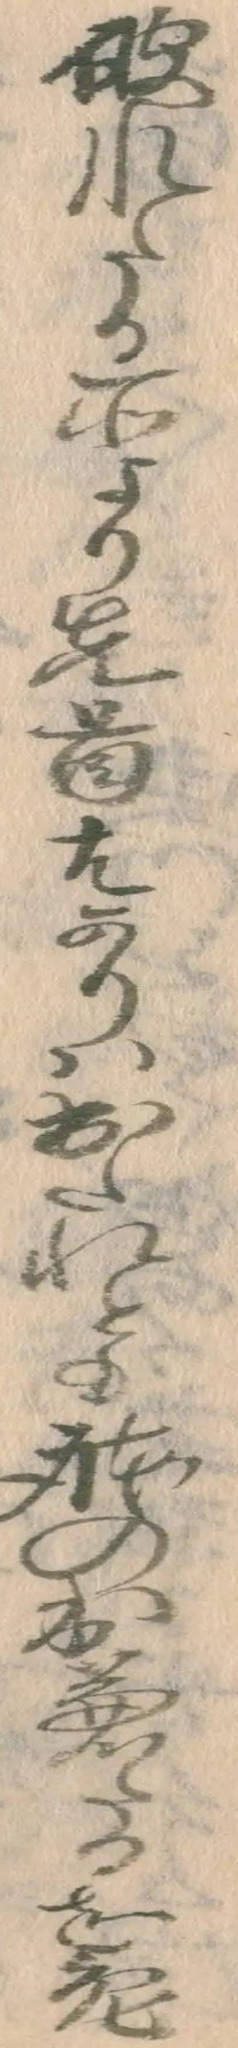破れたる所より先首はかりハ出されとも体の出兼たるを兎
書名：信州大地震之記
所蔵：国立国会図書館 National Diet Library, JAPAN
